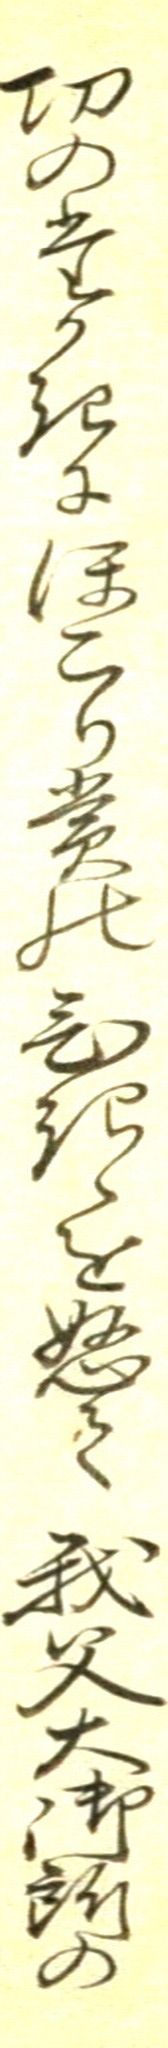功のたかきにほこり賞のひきゝを怒て我父大御所の
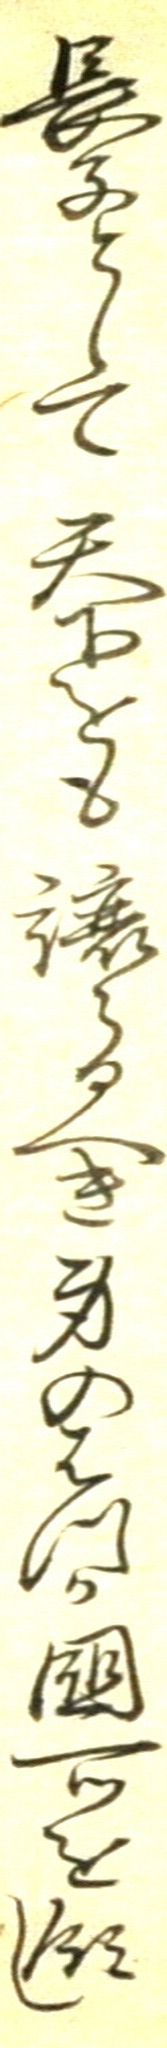長子として天下をも譲らるへき身のはつか国一ッを領し
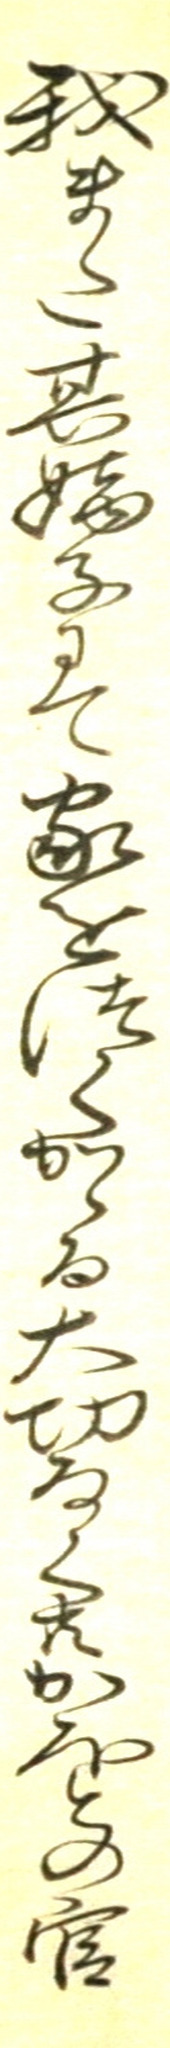我また其嫡子にて家をつくかゝる大切なく共かほとの官
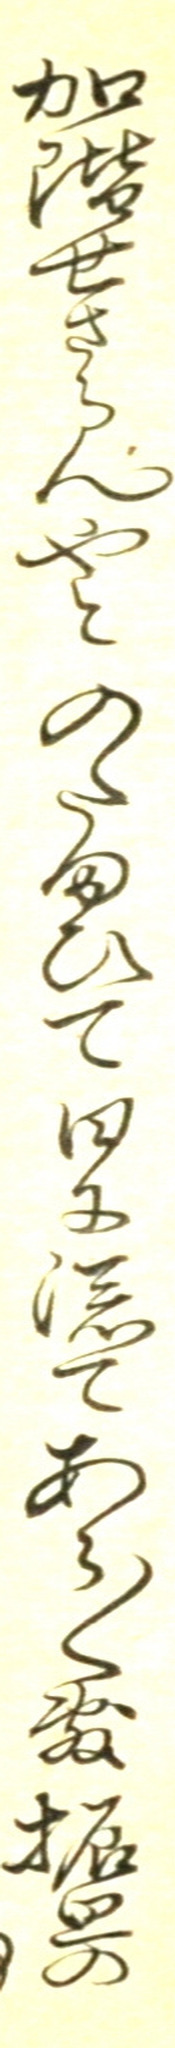加階せさらんやとのたまひて日に添てあら〳〵敷振廻の事
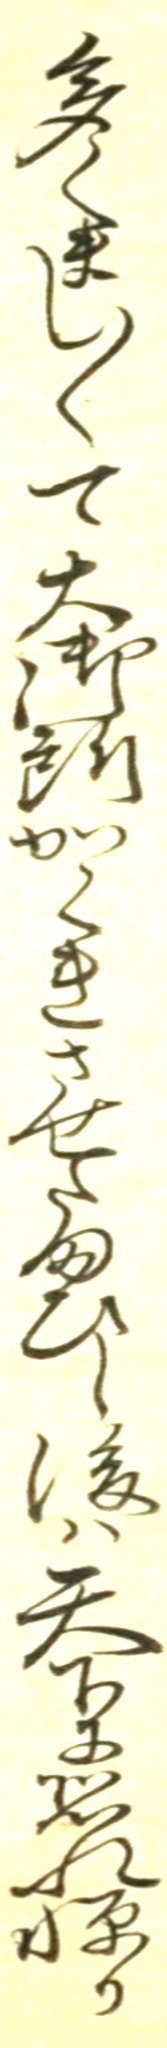多くまし〳〵て大御所かくれさせたまひし後は天下に恐れ憚り
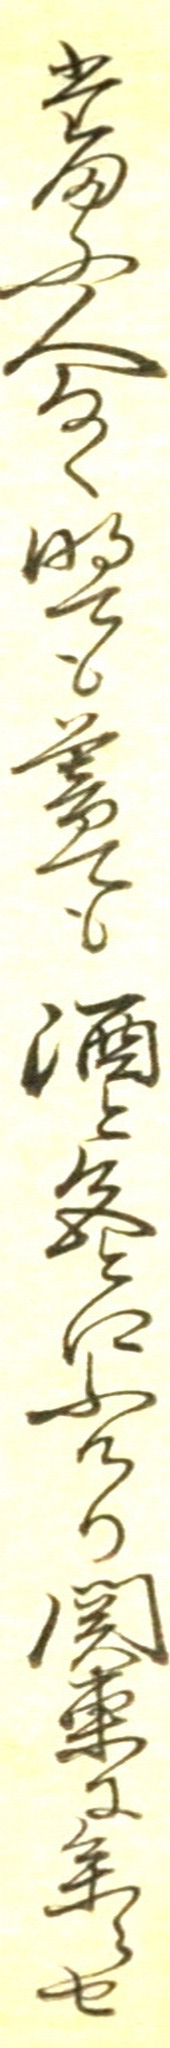たまふ人なく明ても暮ても酒と色とにふけり関東に参らせ
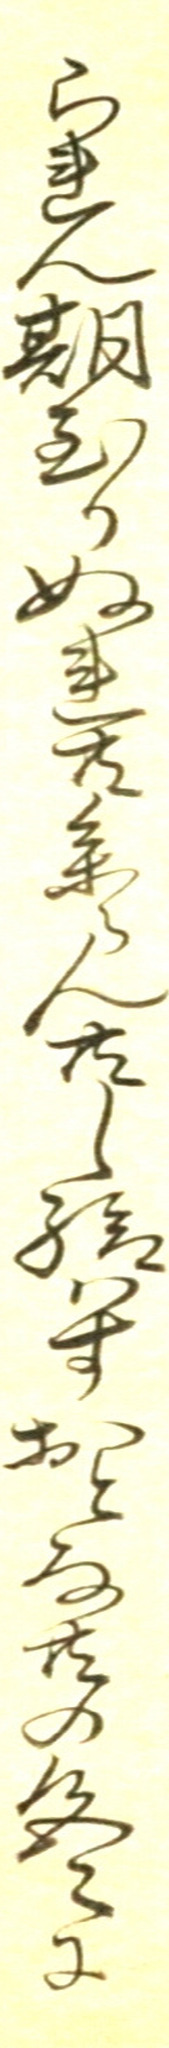られん期至りぬれ共参らん共し給はすおとな共の色々に
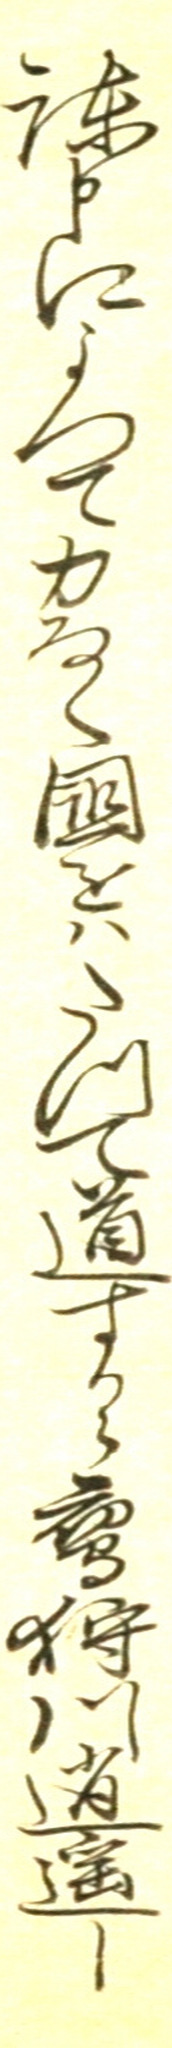諫申によつて力なく国をはたつて道すから鷹狩川逍遥し
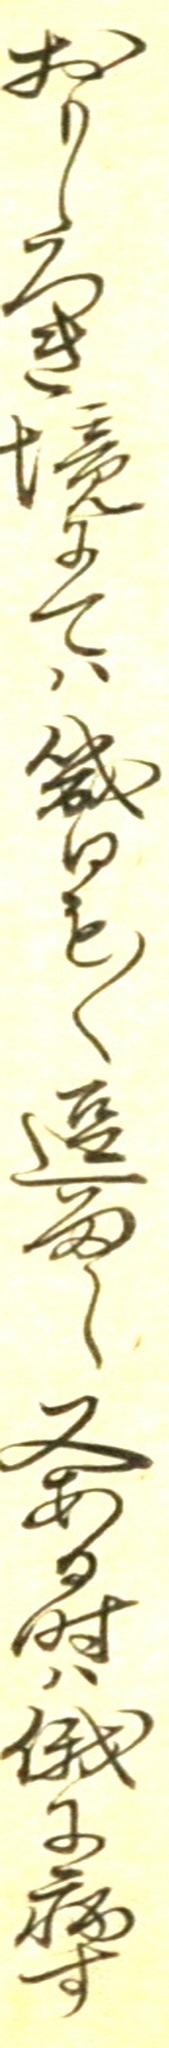おもしろき境にては幾日も〳〵逗留し又ある時は俄に病す
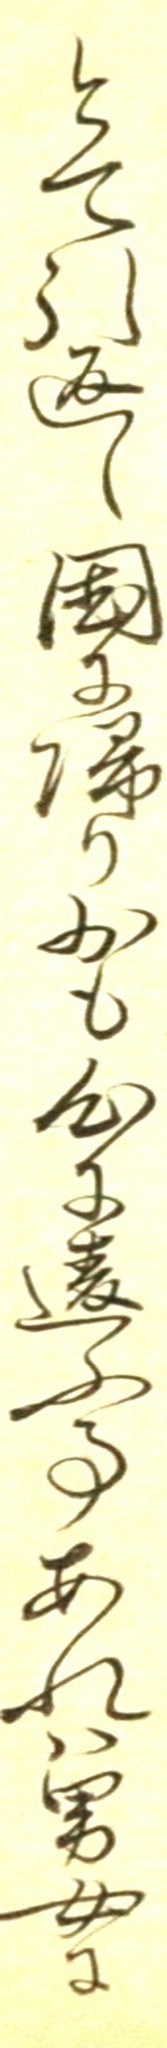とて引返し国に帰り少も心に違ふ事あれは男女に
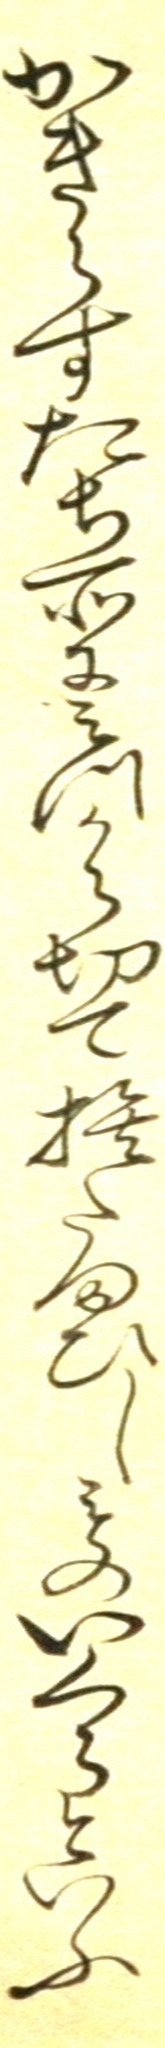かきらすたち所にみつから切て捨たまひしものいくらといふ
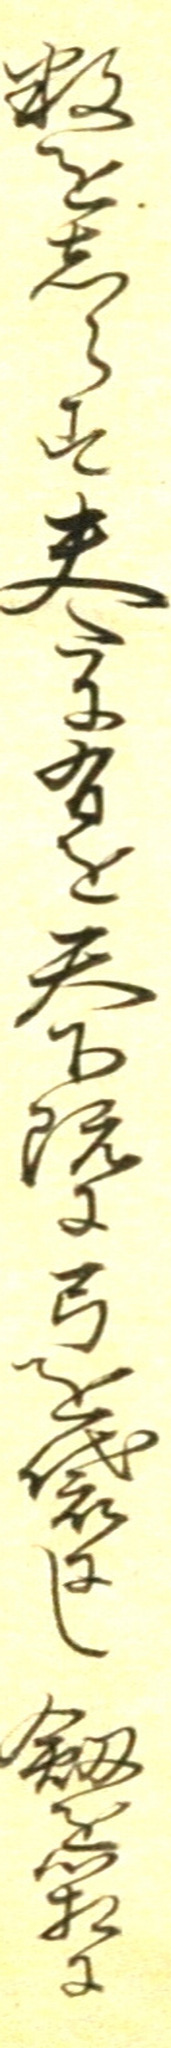数をしらす夫たに有を天下既に弓を袋にし剱を箱に
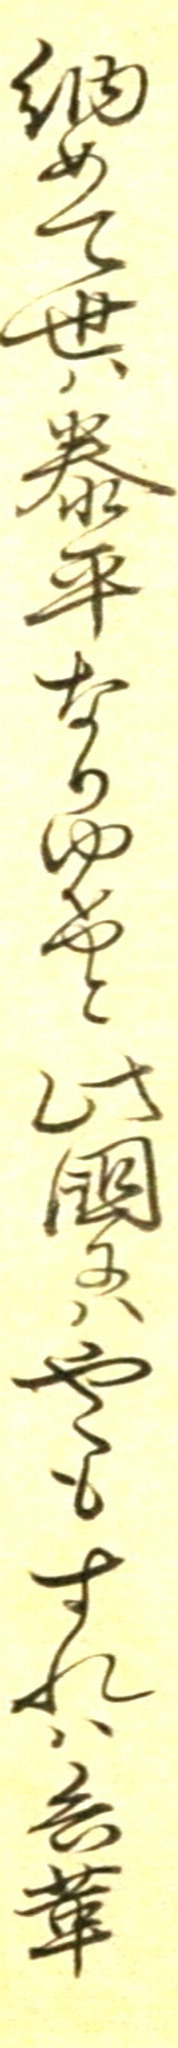納めて世は泰平なりゆけと此国にはやゝもすれは兵革

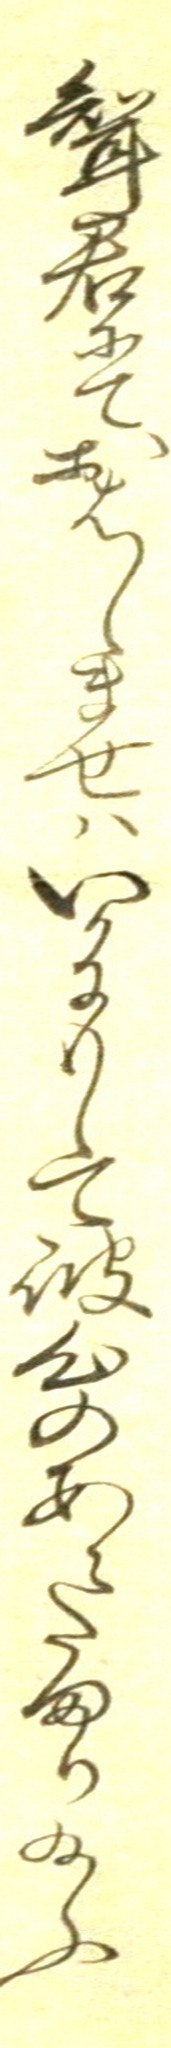聟君にておはしませはいかにもして彼心のあらたまり給ふ
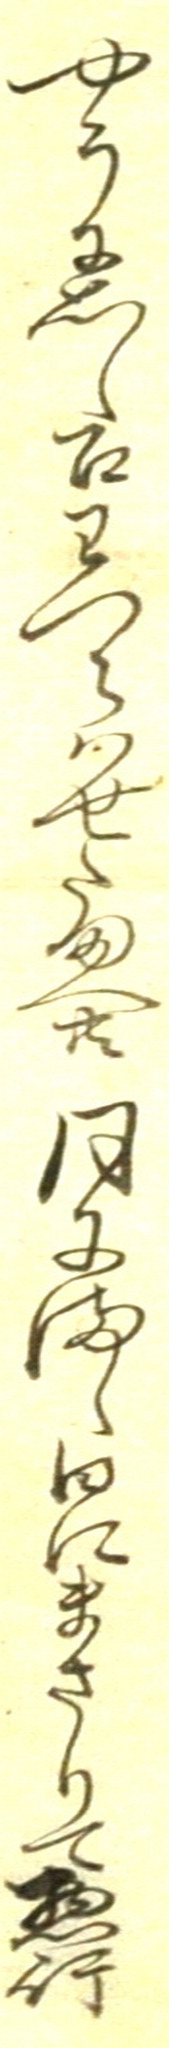やうに思し召わつらはせたまへ共月にまし日にまさりて悪行
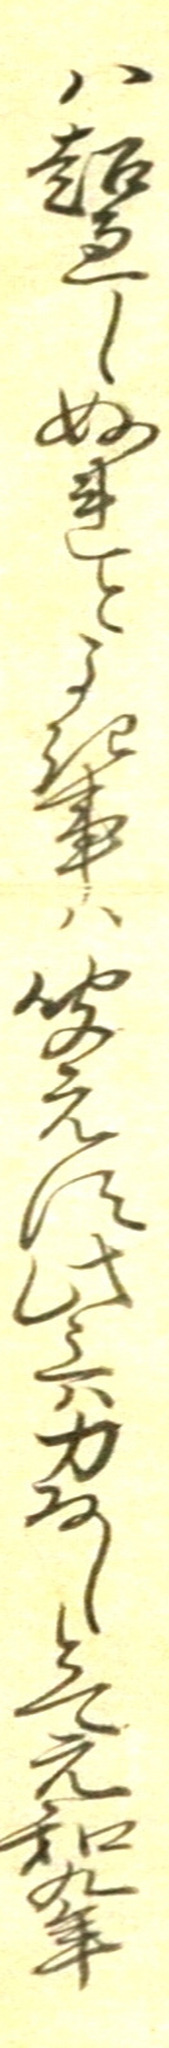は超過しぬれとよき事は聞えす此上は力なしとて元和九年
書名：藩翰譜（一）
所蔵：伊那市立高遠町図書館・合同会社AMANE
